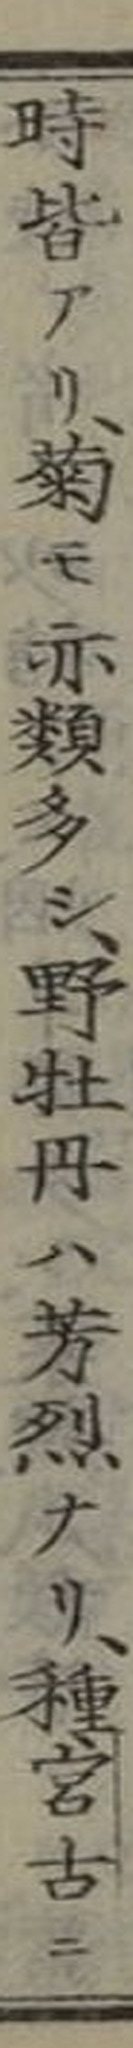時皆アリ、菊モ亦類多シ、野牡丹ハ芳烈ナリ、種、宮古ニ
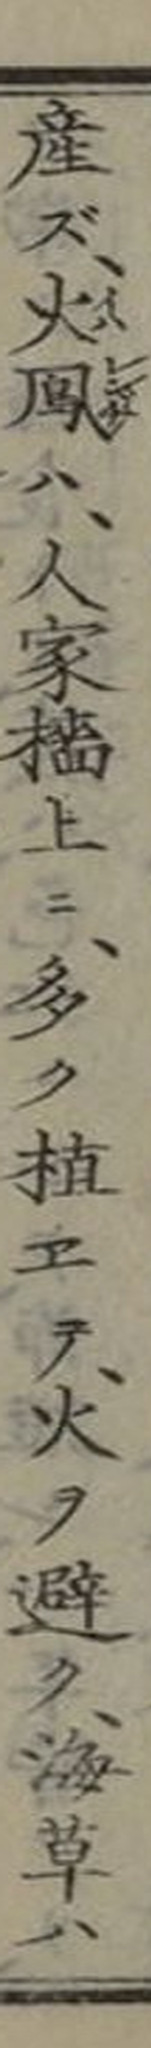産ズ、火鳳ハ、人家牆上ニ、多ク植エテ、火ヲ避ク、海草ハ
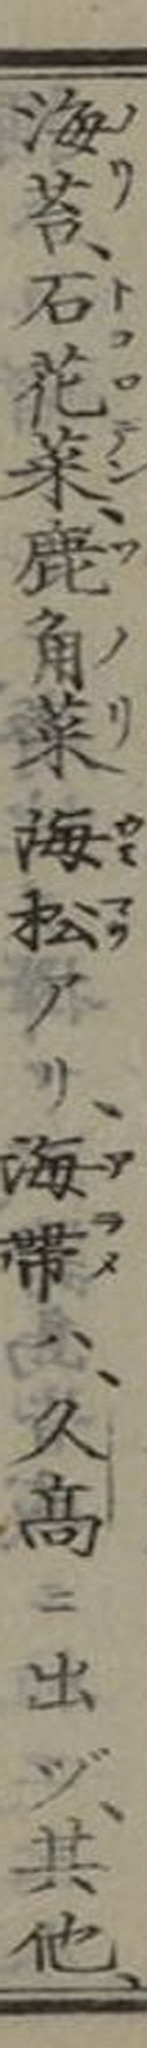海苔、石花菜、鹿角菜海松アリ、海帯ハ、久高ニ出ヅ、其他、
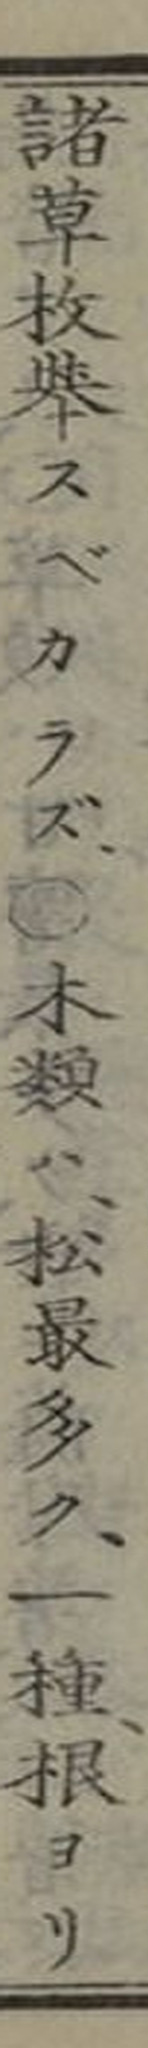諸草枚挙スベカラズ、○木類ハ、松最多ク、一種、根ヨリ
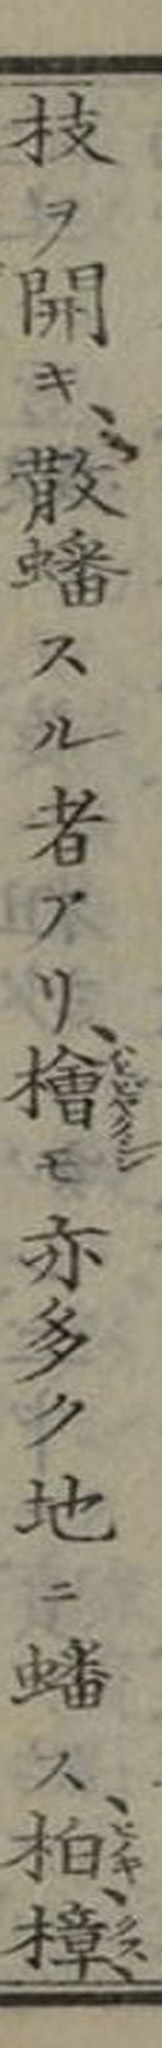枝ヲ開キ、散蟠スル者アリ、檜モ亦多ク地ニ蟠ス、柏、樟、
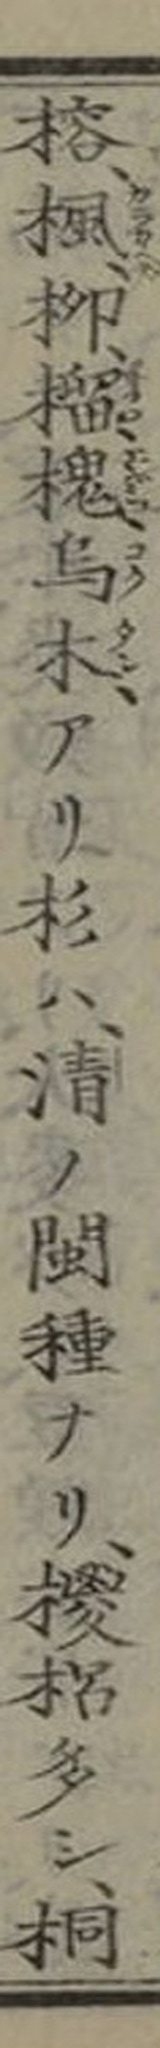榕、楓、柳、榴、槐、烏木、アリ杉ハ、清ノ閩種ナリ、棕梠多シ、桐
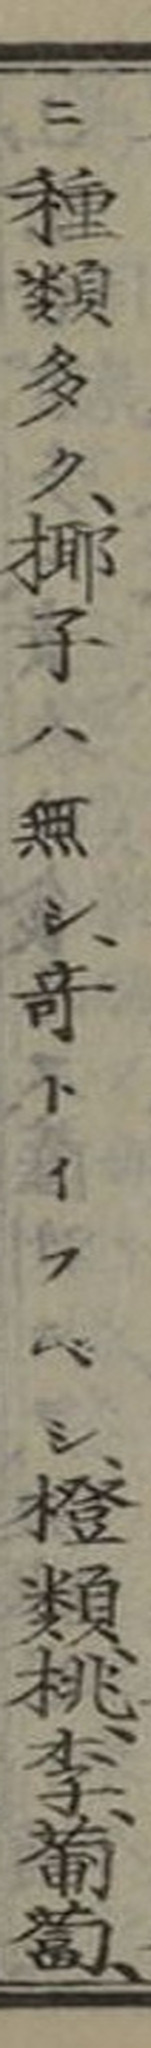ニ種類多ク、椰子ハ無シ、奇トイフベシ、橙類、桃、李、葡萄、
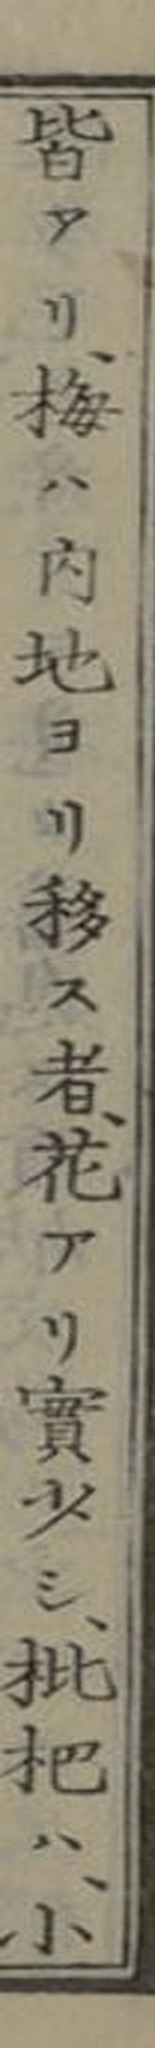皆アリ、梅ハ内地ヨリ移ス者、花アリ実少シ、枇杷ハ、小
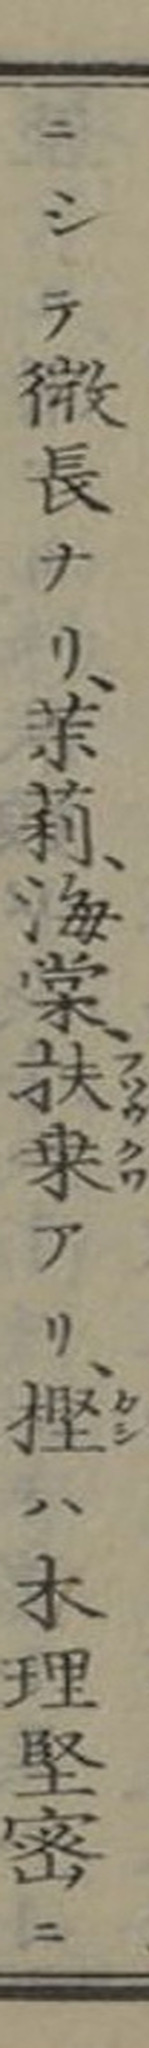ニシテ微長ナリ、茉莉、海棠、扶桑アリ、樫ハ木理堅密ニ
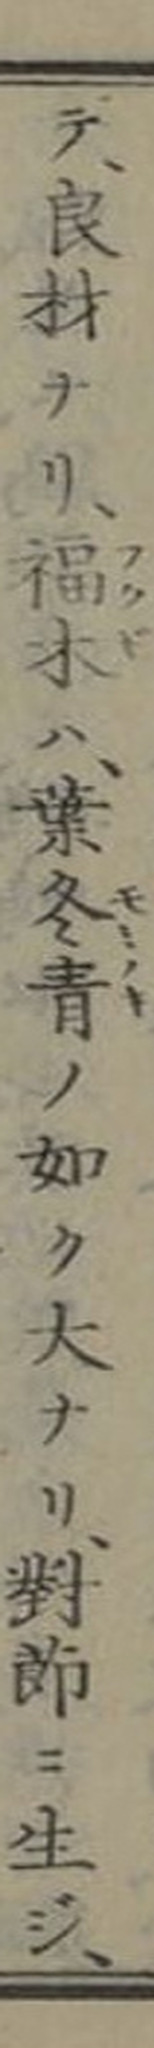テ、良材ナリ、福木ハ、葉冬青ノ如ク大ナリ、対節ニ生ジ、
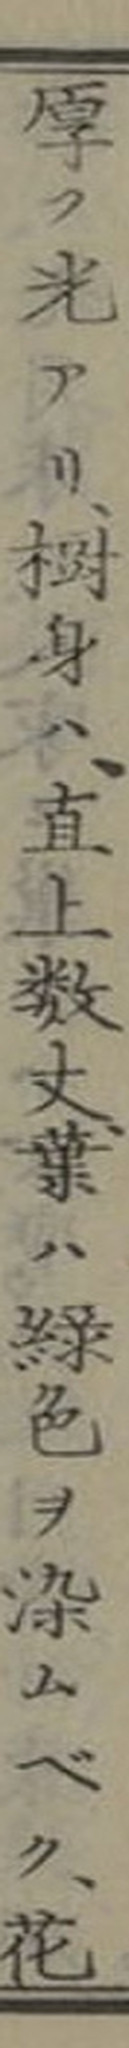厚ク光アリ、樹身ハ、直上数丈、葉ハ緑色ヲ染ムベク、花
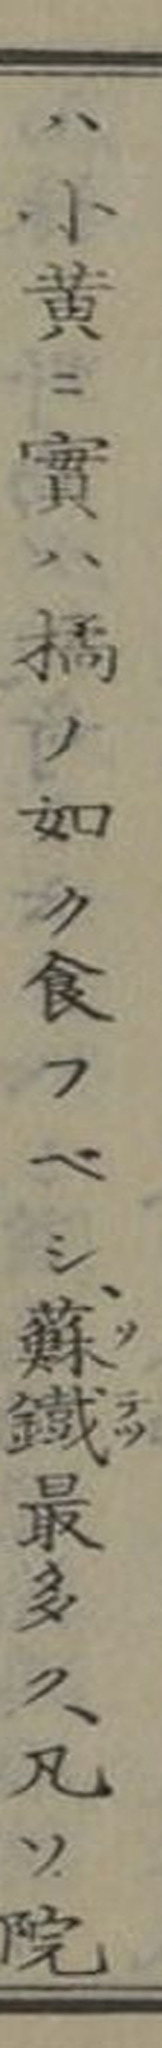ハ小黄ニ実ハ橘ノ如ク食フベシ、蘇鉄最多ク、凡ソ院
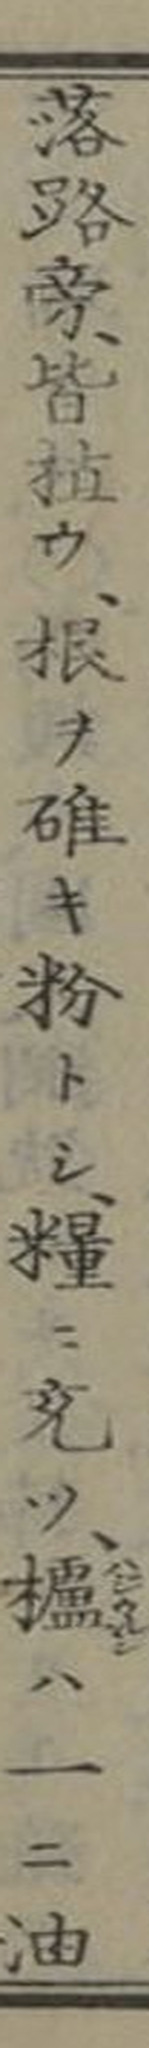落路旁、皆植ウ、根ヲ碓キ粉トシ、糧ニ充ツ、櫨ハ一ニ油
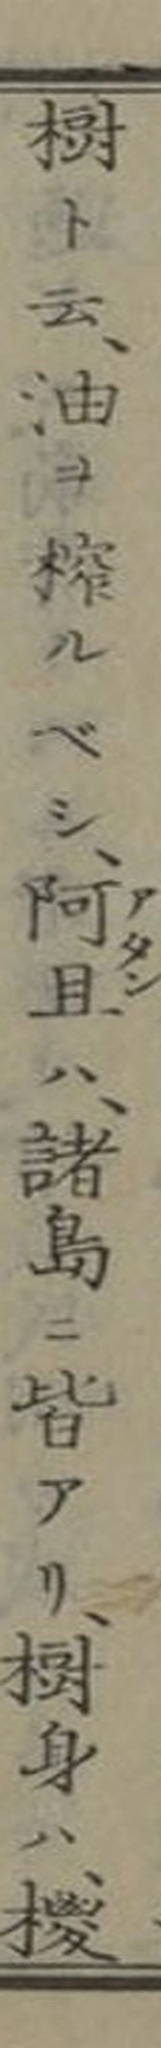樹ト云、油ヲ榨ルベシ、阿旦ハ、諸島ニ皆アリ、樹身ハ、棕
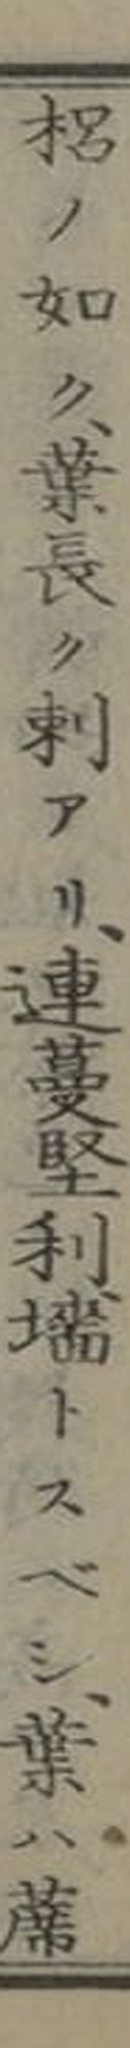梠ノ如ク、葉長ク剌アリ、連蔓堅利、牆トスベシ、葉ハ蓆
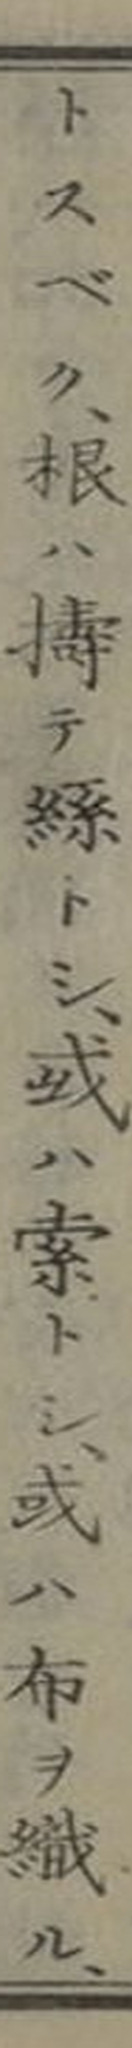トスベク、根ハ擣テ糸トシ、或ハ索トシ、或ハ布ヲ織ル、
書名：琉球新誌 図附 上
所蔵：University of the Ryukyus Library
